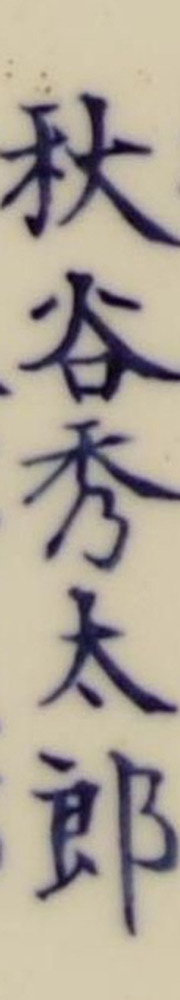秋谷秀太郎
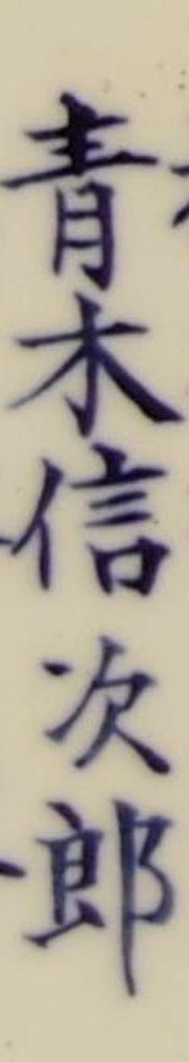青木信次郎
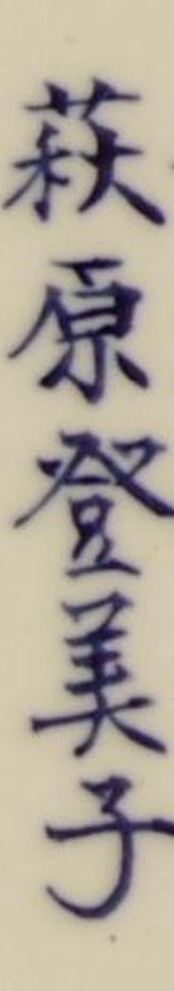萩原登美子
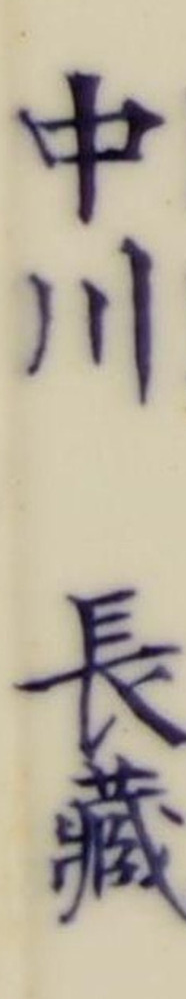中川長蔵

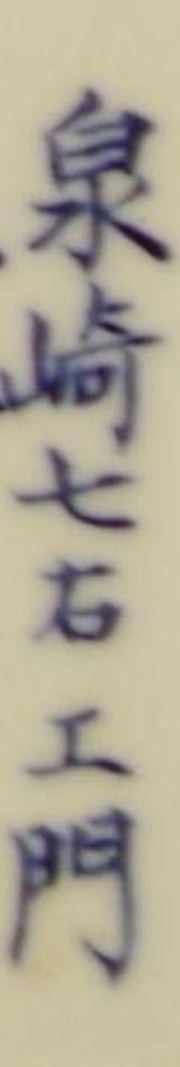泉崎七右エ門
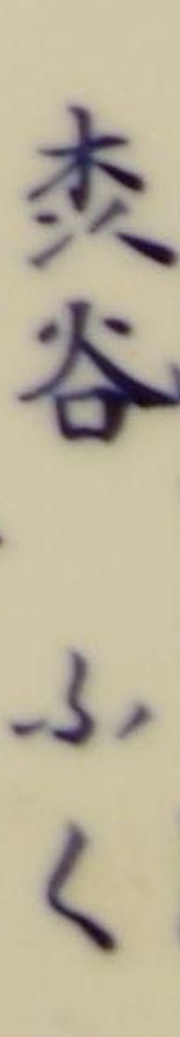森谷ふく
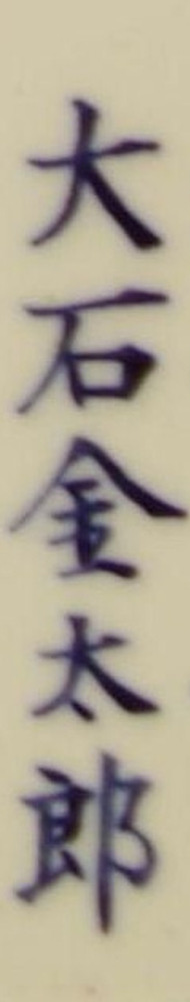大石金太郎
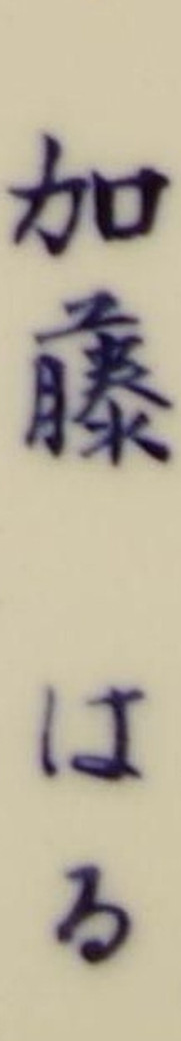加藤はる
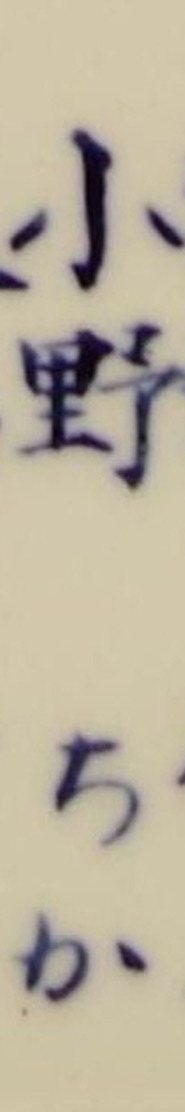小野ちか
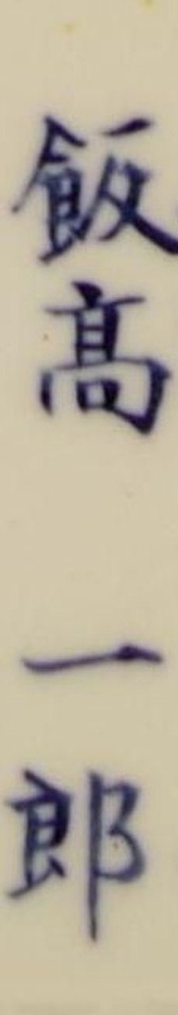飯高一郎
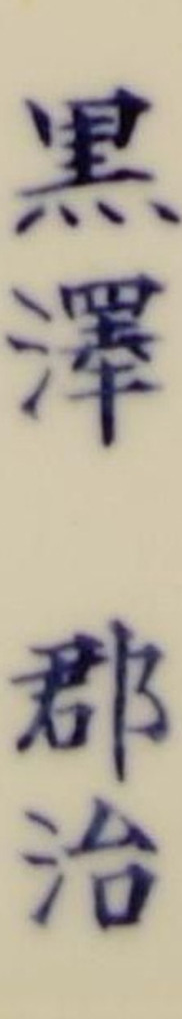黒澤郡治
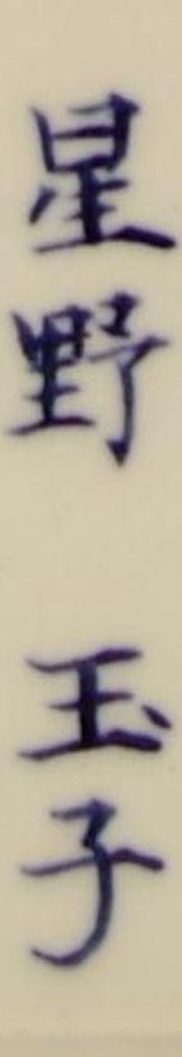星野玉子
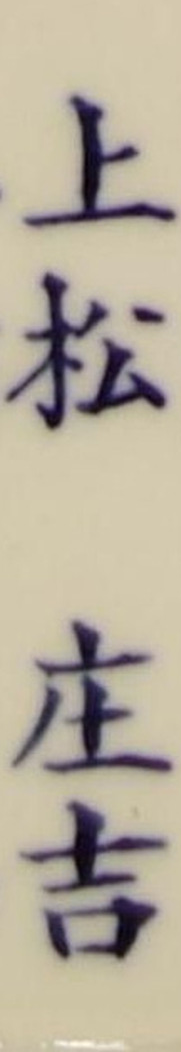上松庄吉
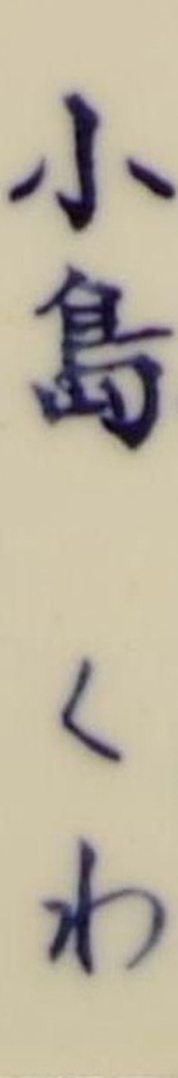小島くわ
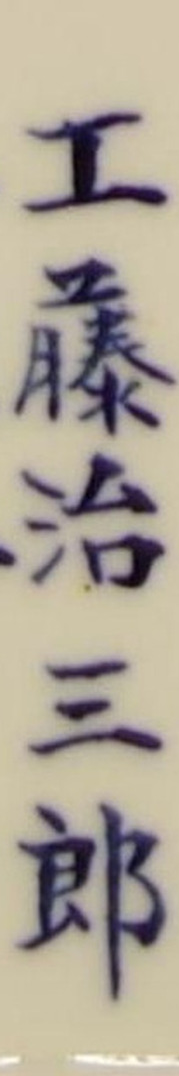工藤治三郎
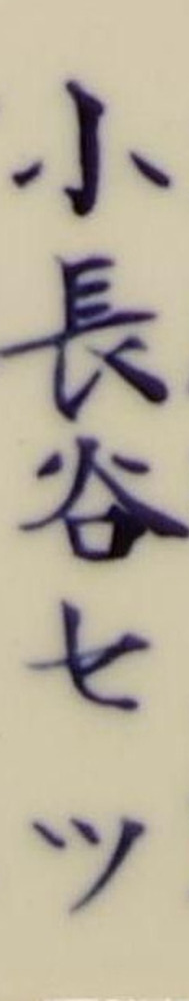小長谷セツ
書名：E~L
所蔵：高野山金剛峯寺
